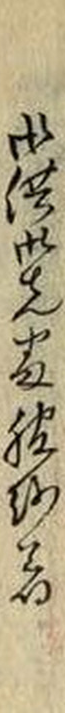御供御先番服紗着
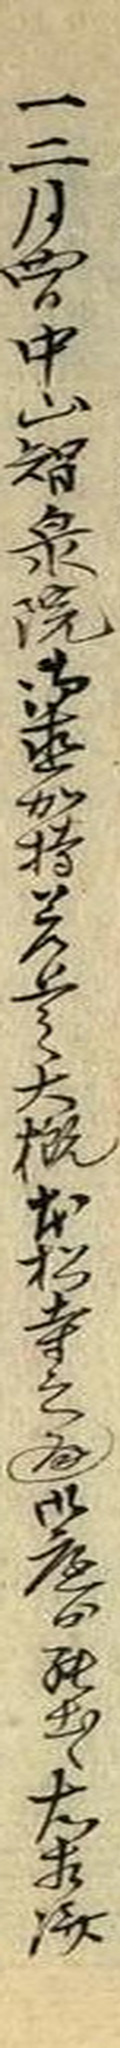一二月四日中山智泉院御直加持差上之大概本松寺之通御庭ゟ罷出候右相済
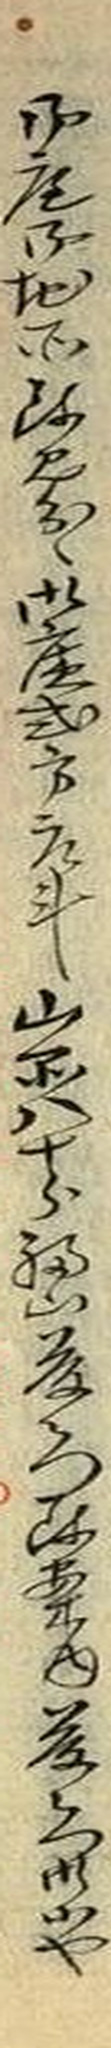御庭御地所致見分候御広式方取斗山品八十郎福山藤右衛門致案内藤右衛門御小や
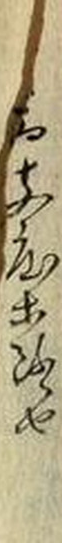ニ而支度等致候由
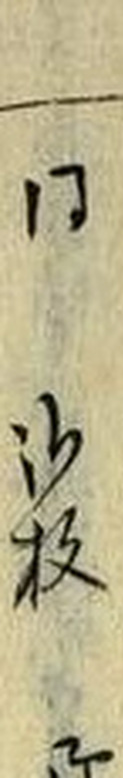同壱枚
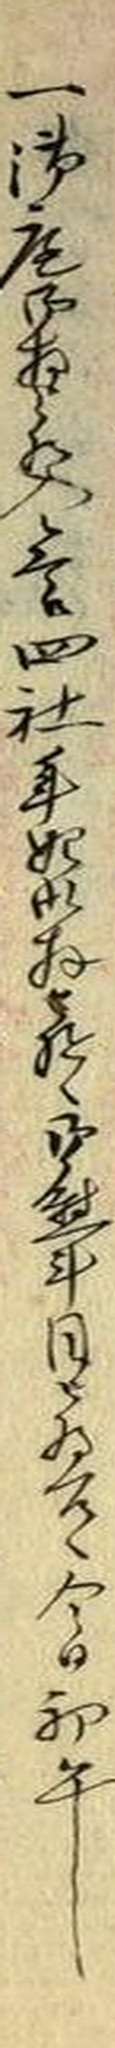一御庭御拝為入候節四社年始御拝被遊候御熨斗目被為召候今日初午
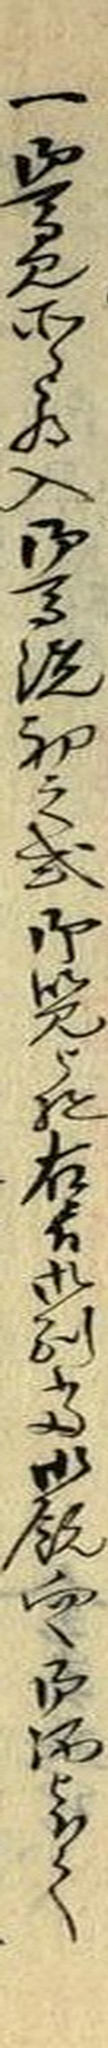一御馬見所へ被為入御馬洗初之式御覧被遊右ニ付御別当御厩向へ御酒被下之
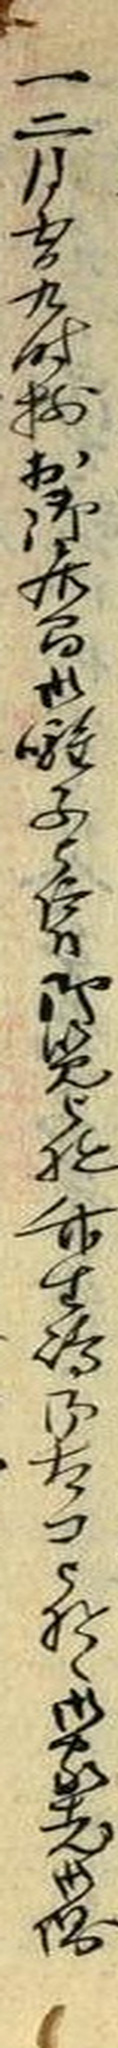一二月五日九時揃於御居間御囃子被仰付御覧被遊竹生島御太コ被遊候御家老御側
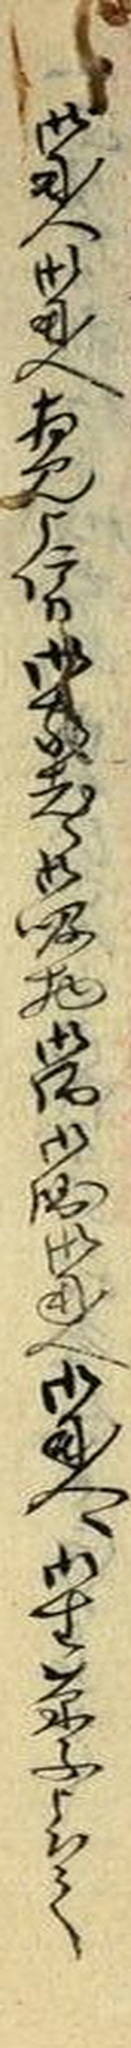御用人御用人拝見被仰付御家老へ御吸物御酒御側御用人御用人へ御生菓子被下之
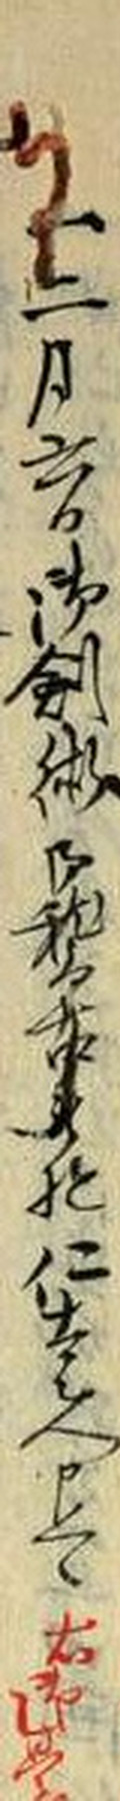一二月六日御剣術御稽古被遊仁太夫申上候
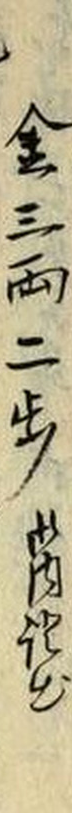金三両二歩御内証出
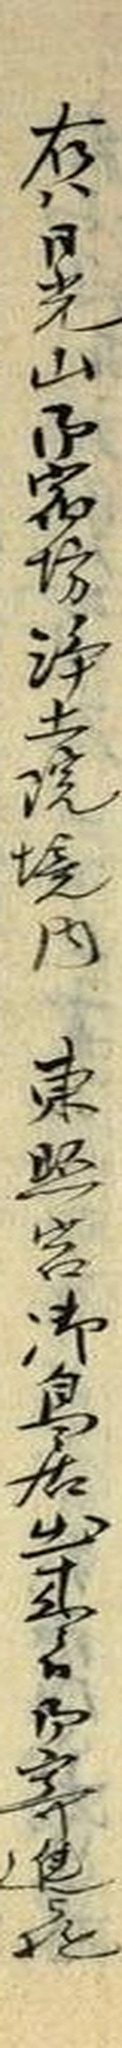右ハ日光山御宿坊浄土院境内東照宮御鳥居出来候ニ付御寄進被遊
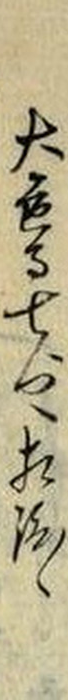大道寺七右衛門へ相渡候
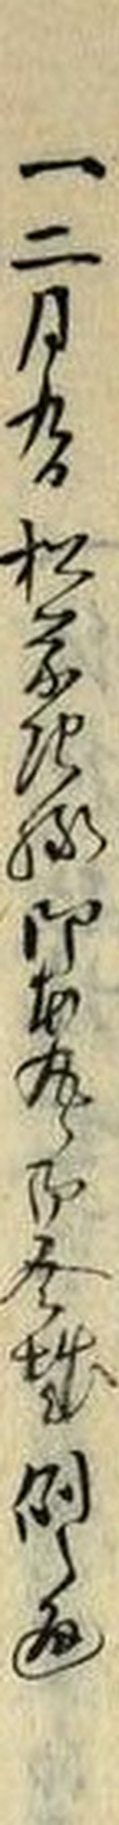一二月九日松栄院様御本丸へ御登城例之通
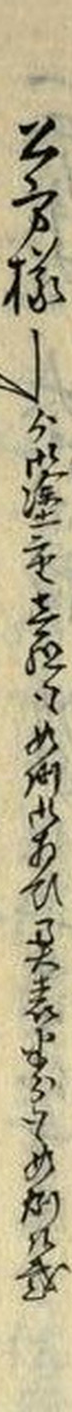公方様―ゟ御塗重壱組ツヽ如例御物頭奥表半分ツヽ如例頂戴
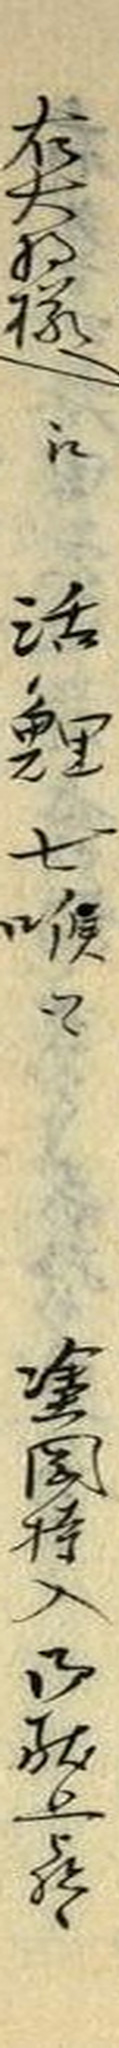右大将様江活鯉七喉ツヽ塗岡持入御献上被遊候
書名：少傅日録抄（斉善付側向頭取日記、江戸并道中、初入在国、逝去後…
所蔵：福井県文書館 Fukui Prefectural Archives
